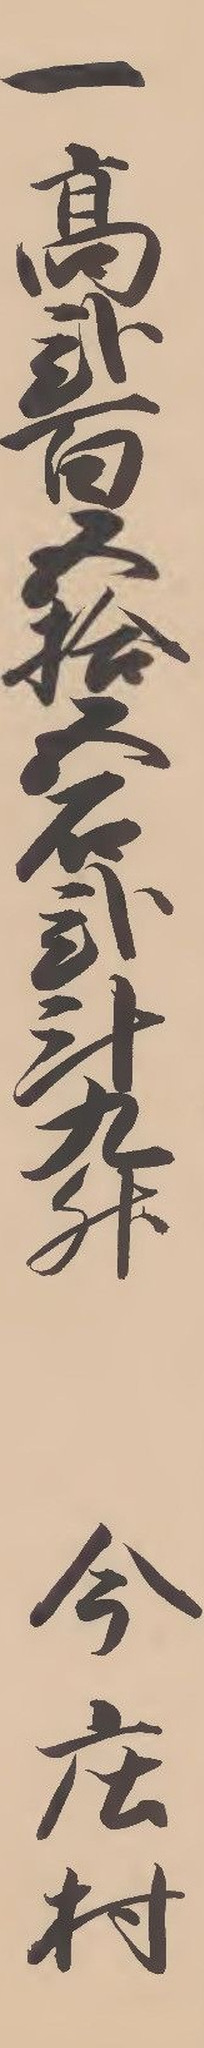一高弐百五拾五石弐斗九升今庄村
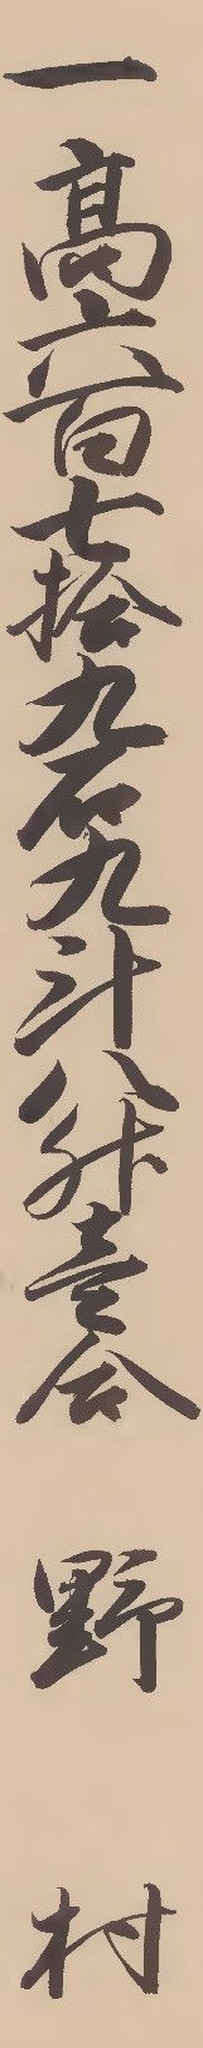一高六百七拾九石九斗八升壱合野村
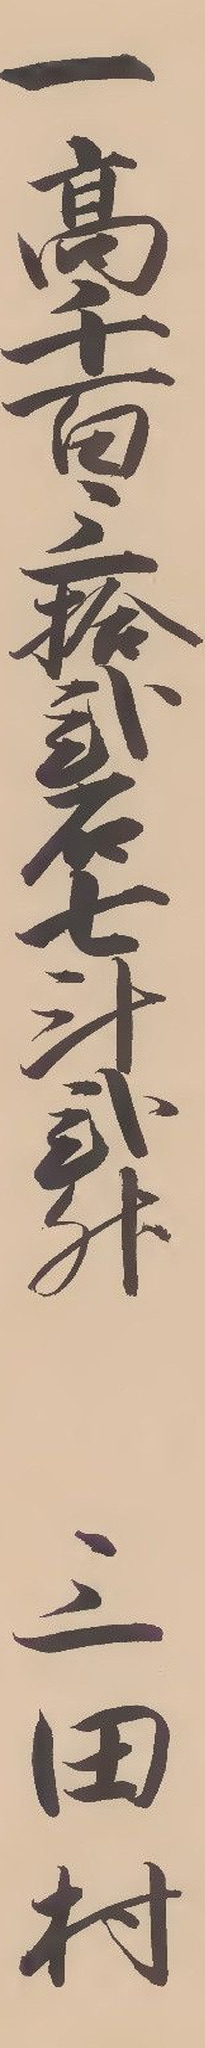一高千百三拾弐石七斗弐升三田村

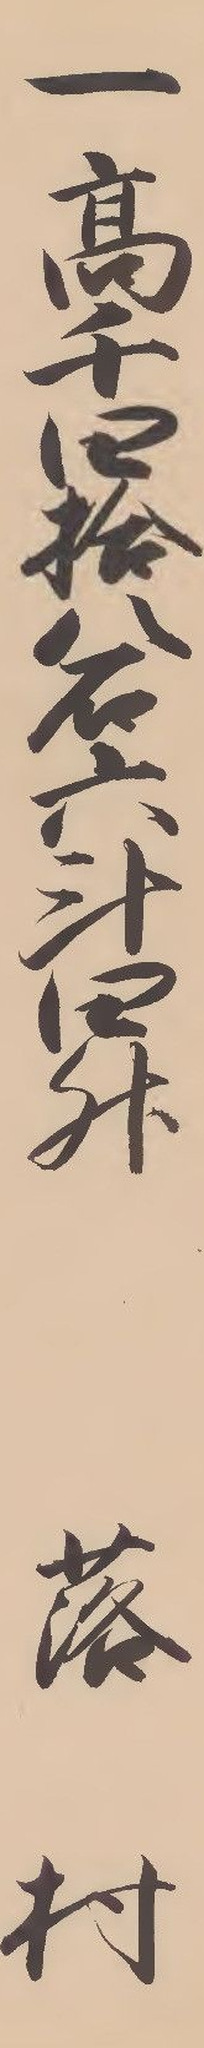一高千四拾八石六斗四升落村
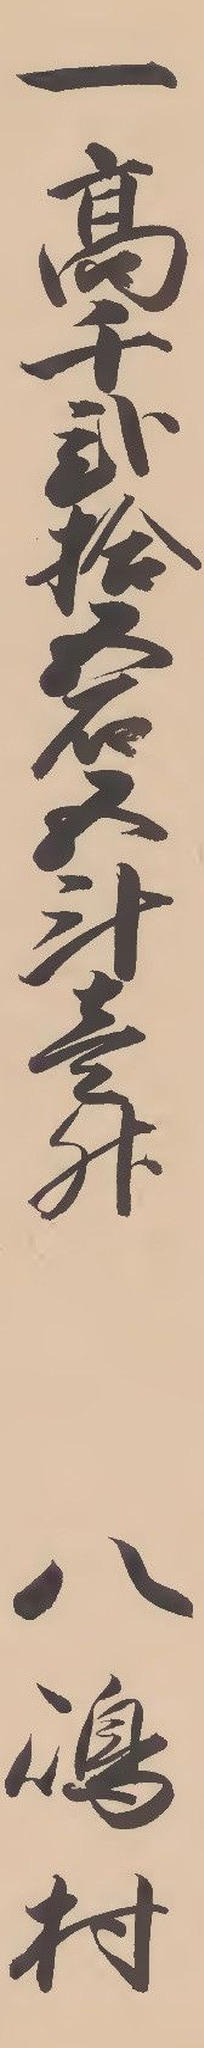一高千弐拾五石五斗壱升八島村
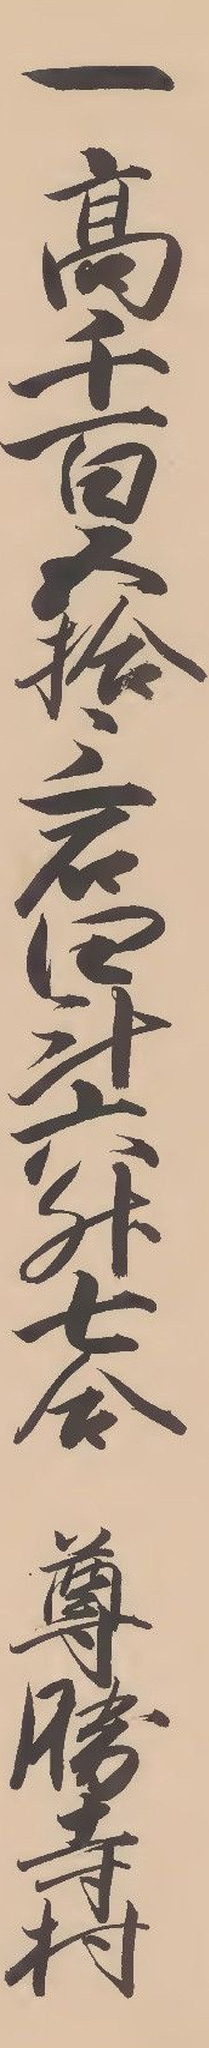一高千百五拾三石四斗六升七合尊勝寺村
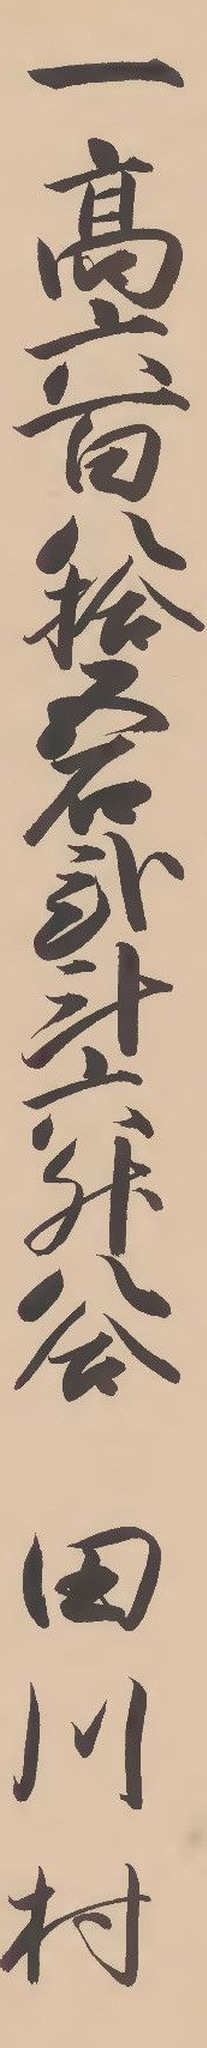一高六百八拾五石弐斗六升八合田川村
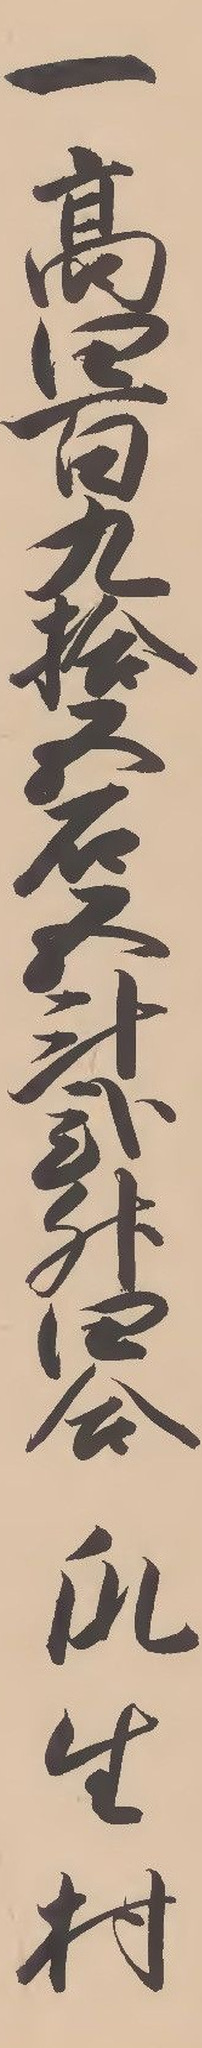一高四百九拾五石五斗弐升四合瓜生村
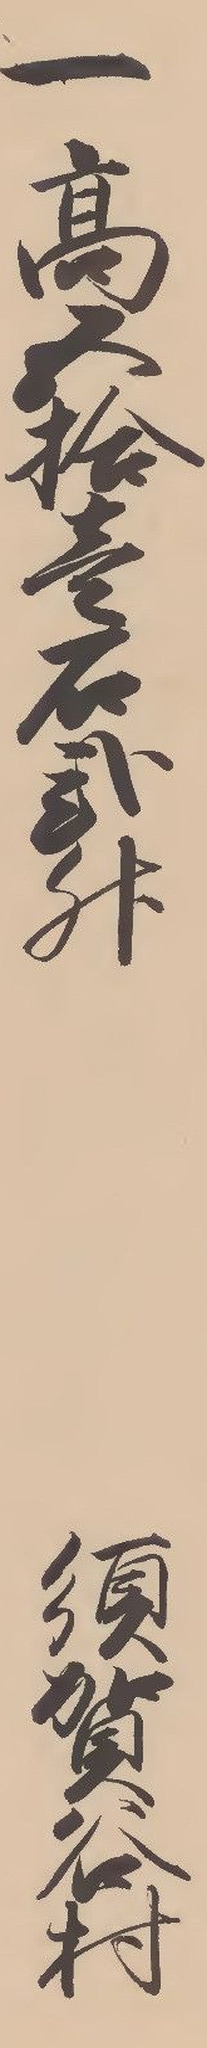一高五拾壱石弐升須賀谷村
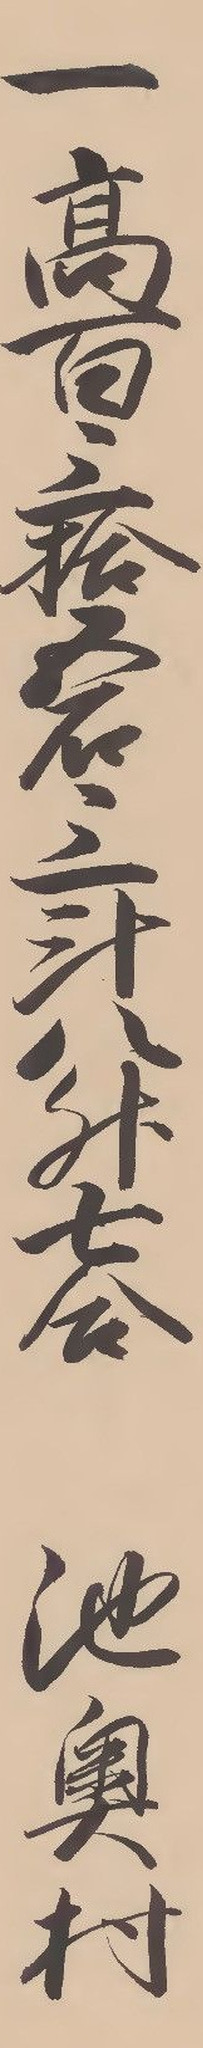一高百三拾五石三斗八升七合池奥村
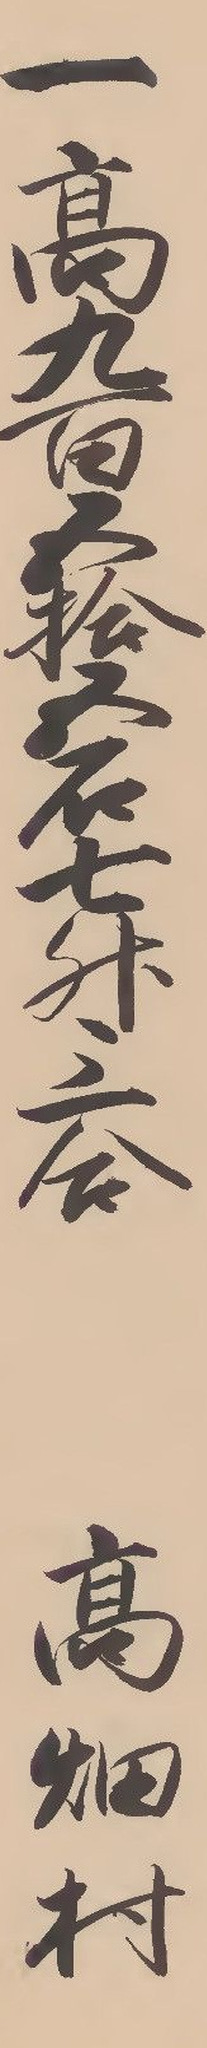一高九百五拾五石七升三合高畑村

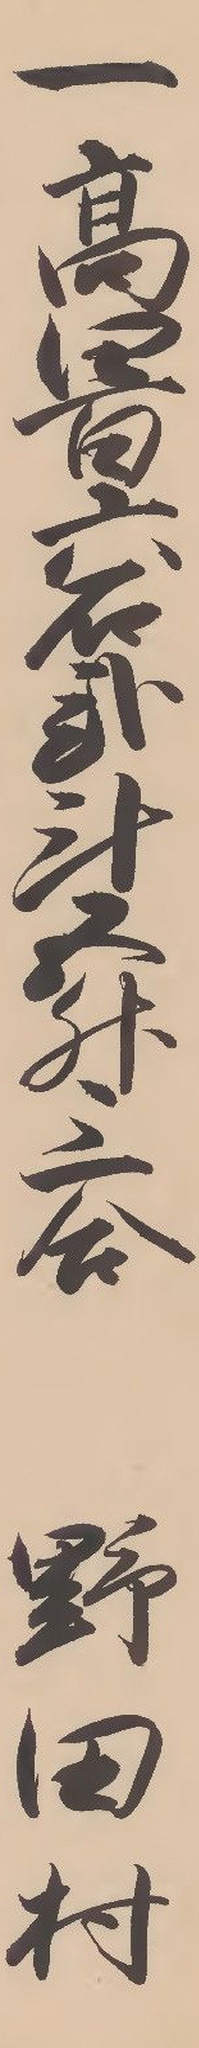一高四百六石弐斗五升三合野田村
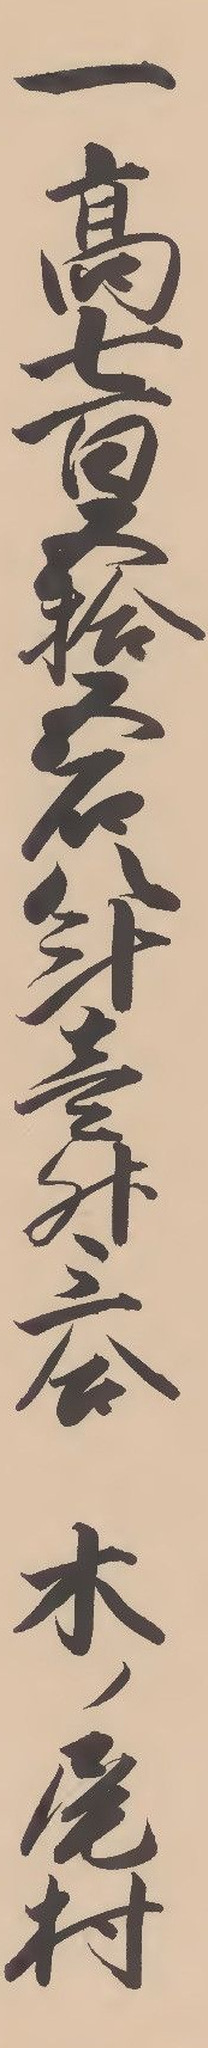一高七百五拾五石八斗壱升三合木ノ尾村
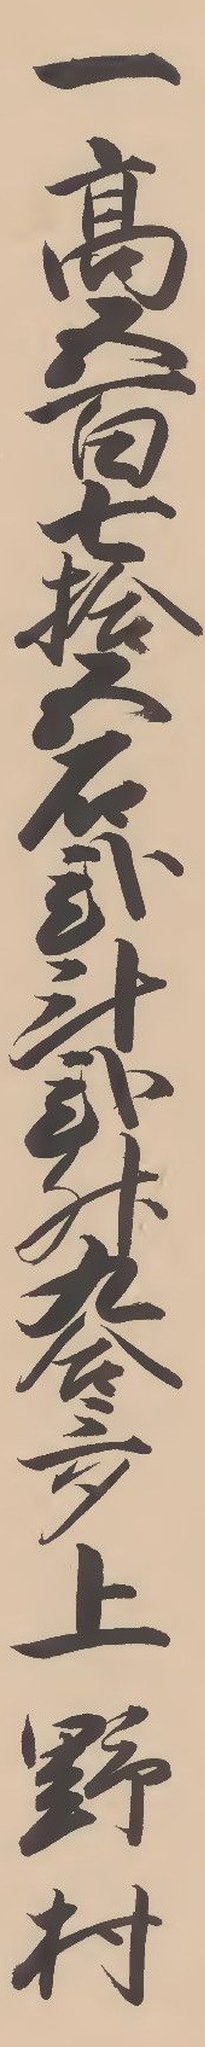一高五百七拾五石弐斗弐升九合三勺上野村
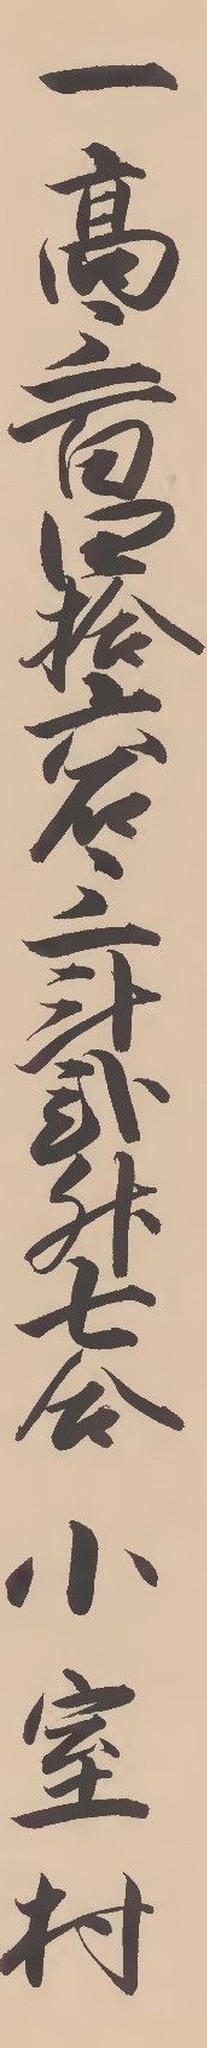一高三百四拾六石三斗弐升七合小室村
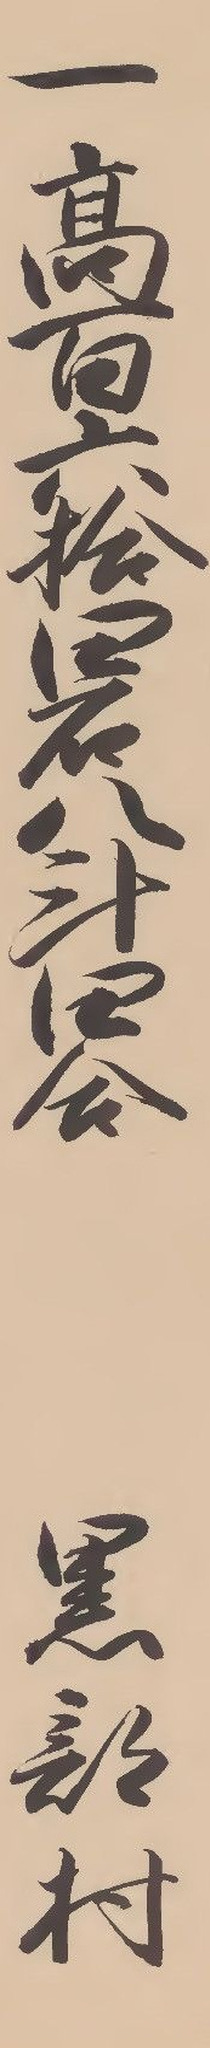一高百六拾四石八斗四合黒部村
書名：近江国郷帳
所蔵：国立公文書館 National Archives of Japan
